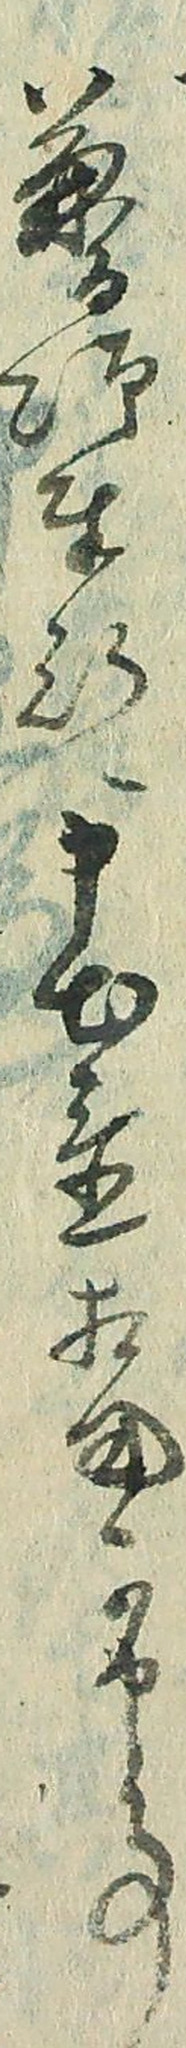兼而御奉行へ申出置相用可申事
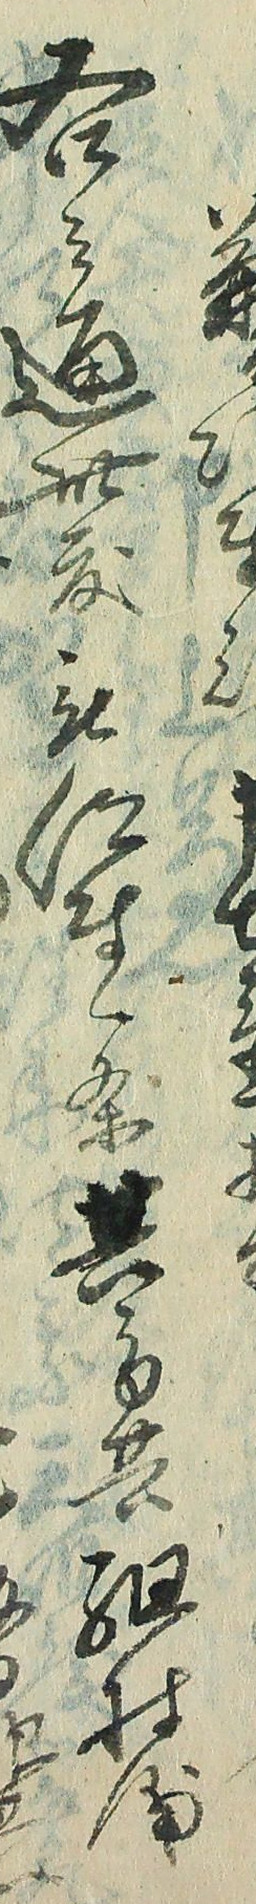右之通此度被仰付候条其方共組村浦
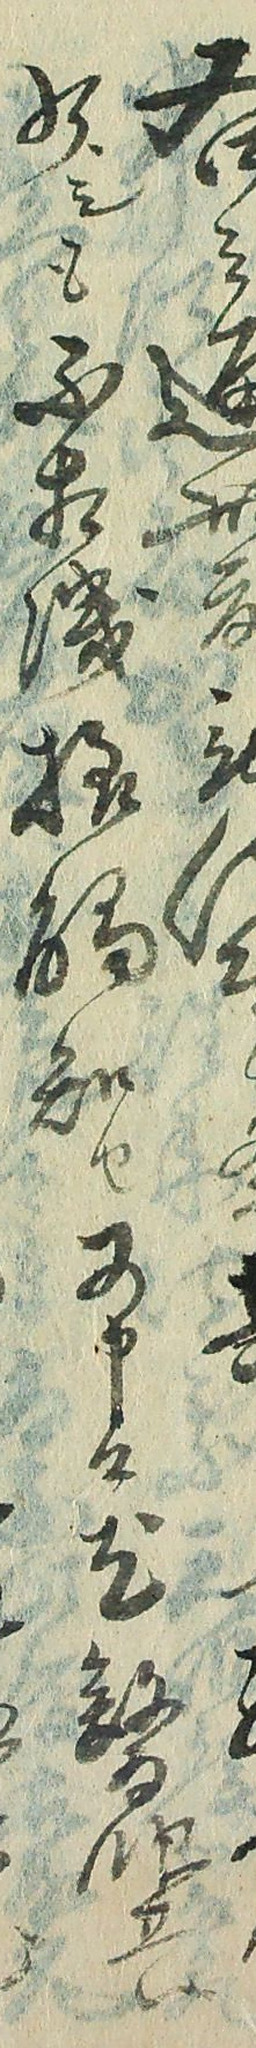少しも不相洩様触知せ可申候尤医師共
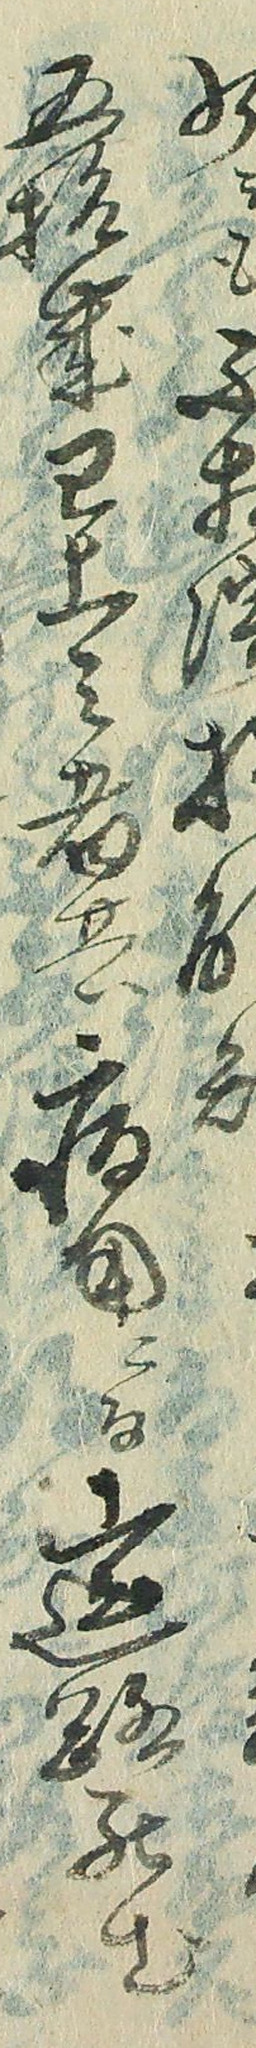五拾歳已上之者共病用に而遠路罷出
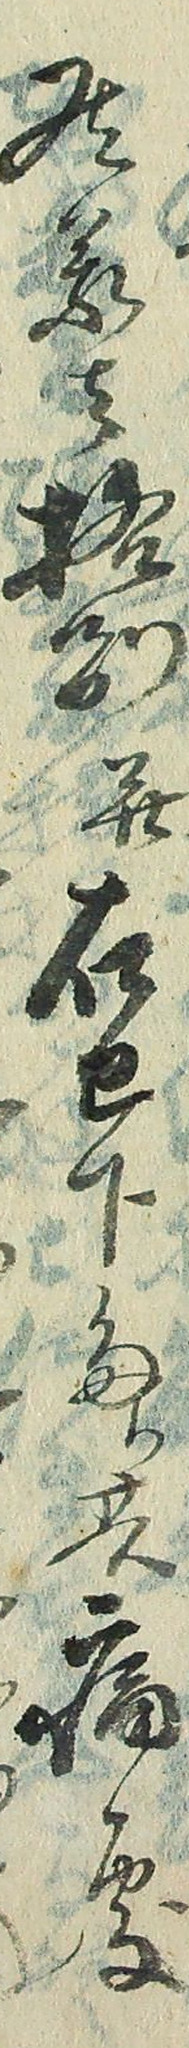候義は格別幷右已下たり共痛処
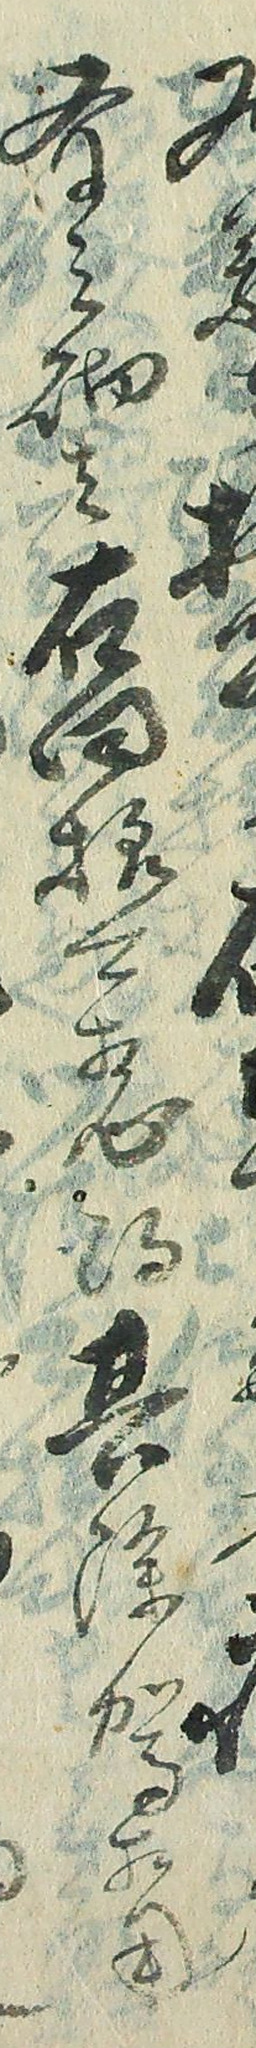有之砌は右同様可相心得其余駕相用
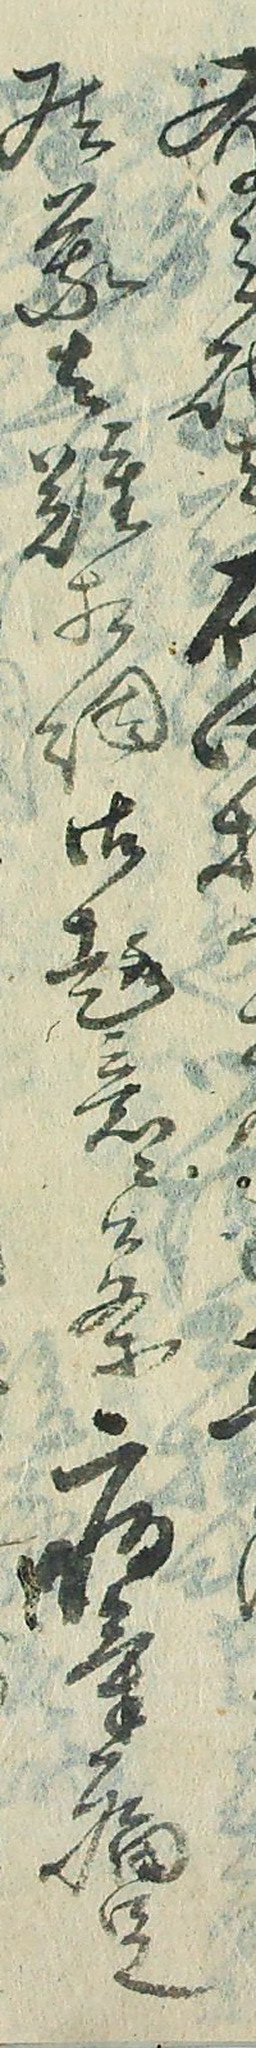候義は難相調御趣意に候条病気痛足
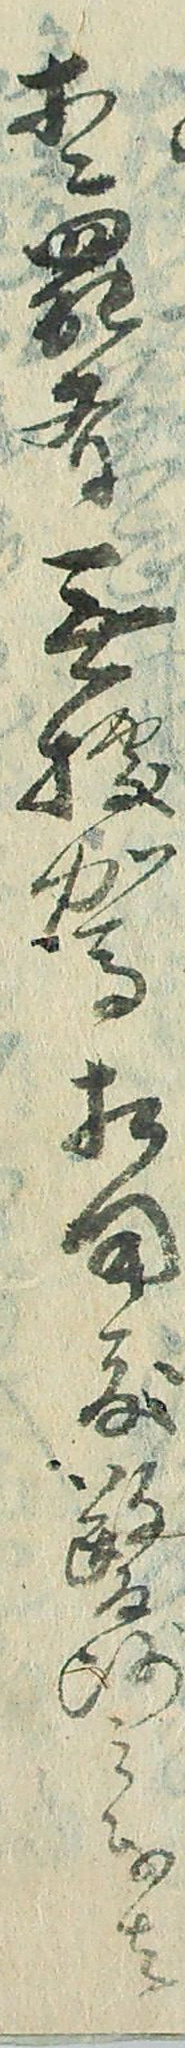等に罷有無據駕相用度医師之義は

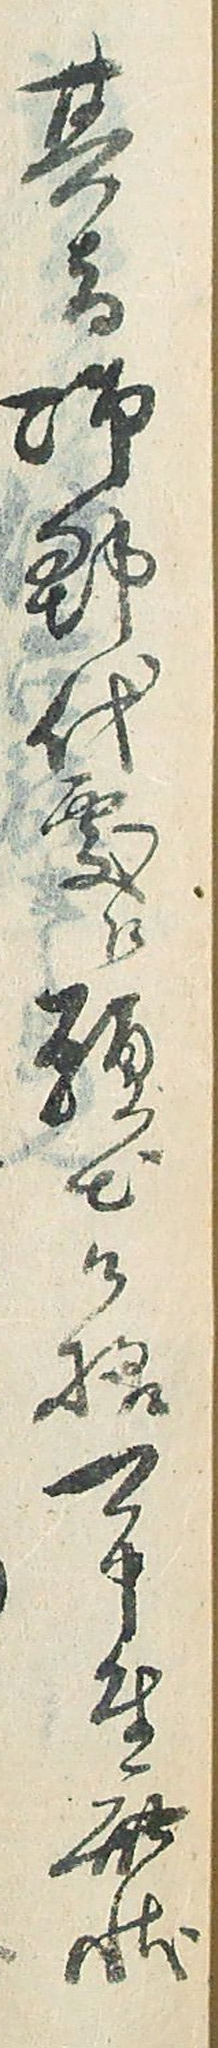其旨御郡代処江願出候様可申付候此状
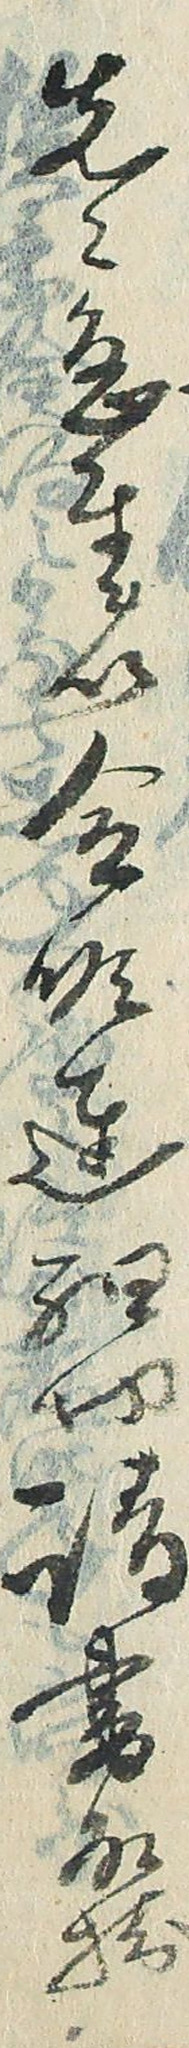先々急付を以令順達組切請書取揃
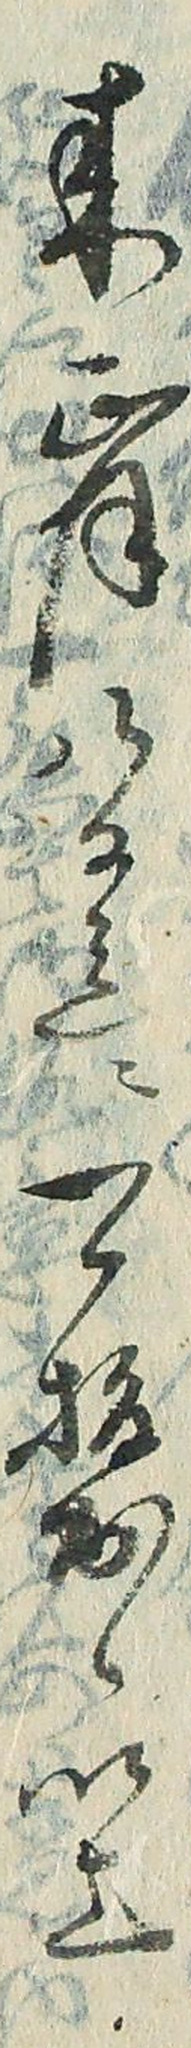来正月八日迄に可指出候以上
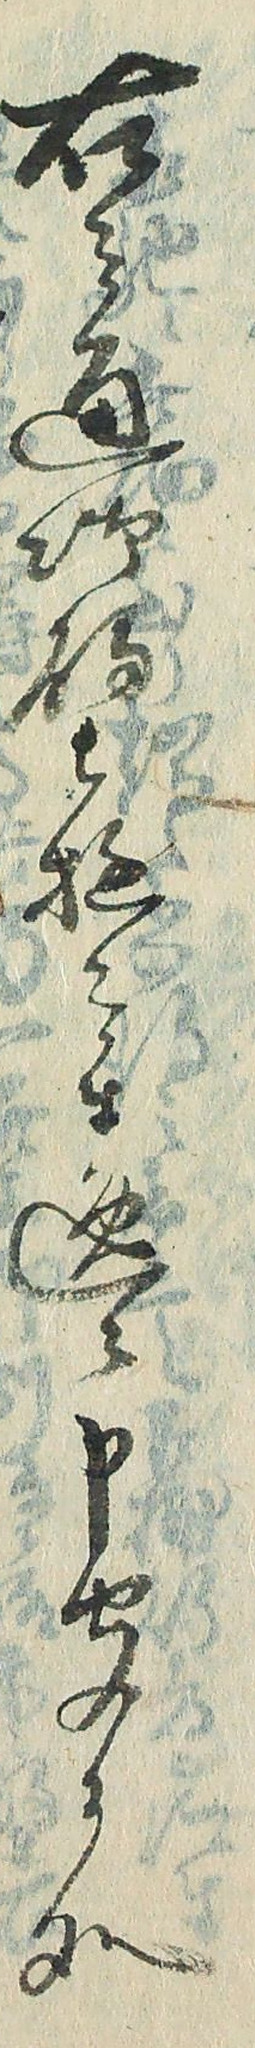右之趣御触被遊候に付逸々申聞候処
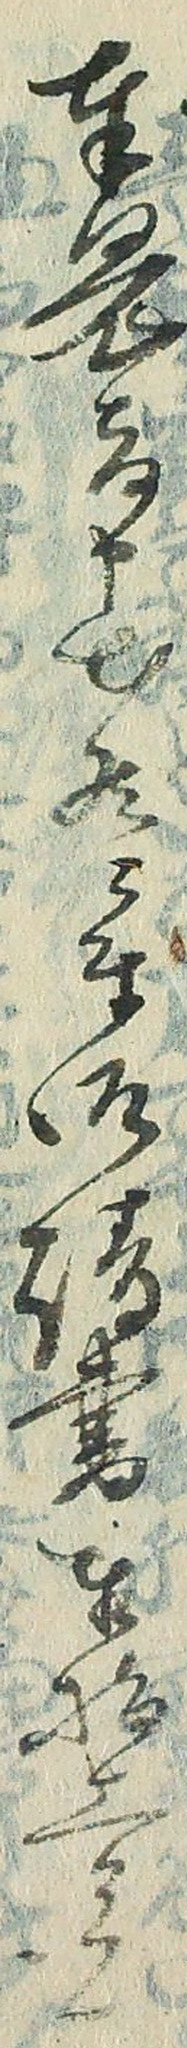奉畏旨申出候に付御請書奉指上候以上
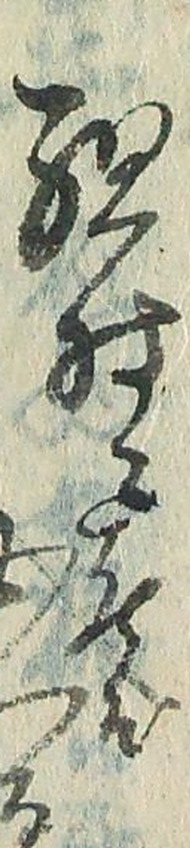組村々庄屋
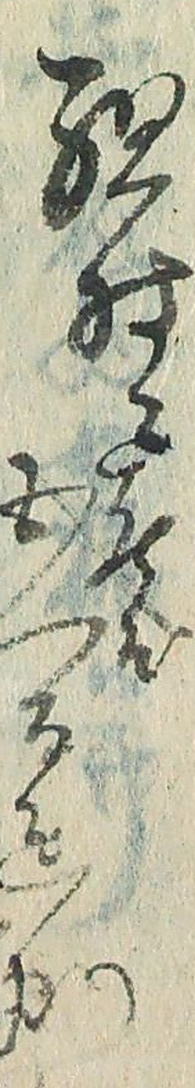組村々庄屋
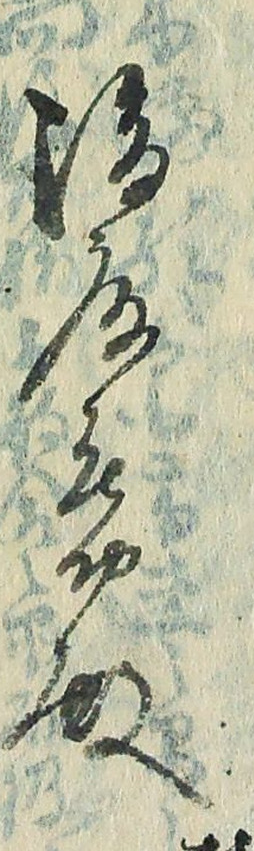後藤庄助殿
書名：諸御用御□受書控
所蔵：鳴門教育大学 Naruto University of Education
